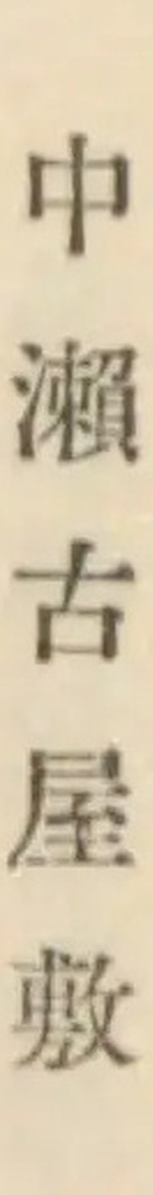附録古屋敷
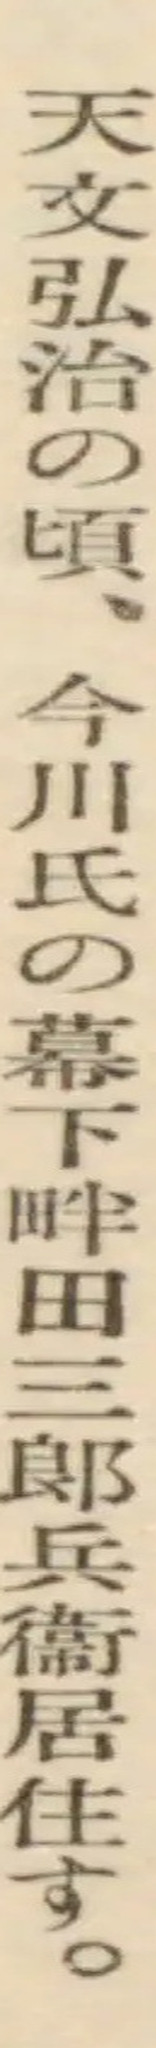天文弘治の頃、今川氏の幕下畔田三郎兵衛居住す。
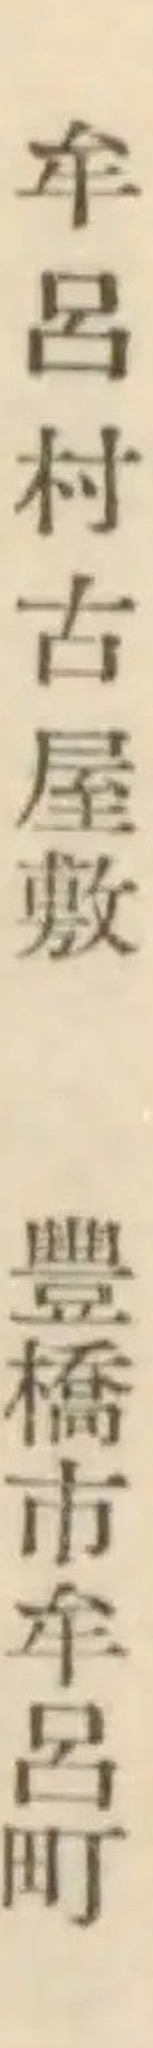牟呂村古屋敷豊橋市牟呂町
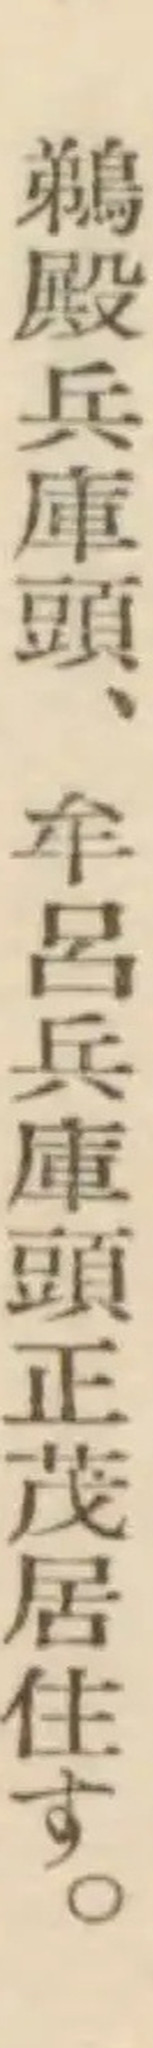鵜殿兵庫頭、牟呂兵庫頭正茂居住す。
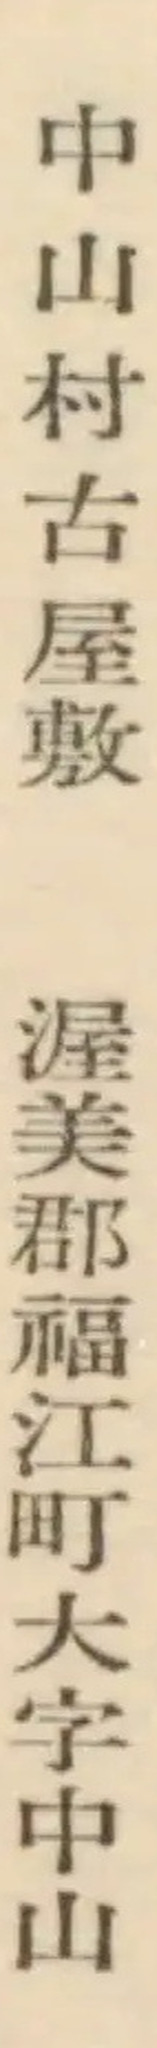中山村古屋敷渥美郡福江町大字中山
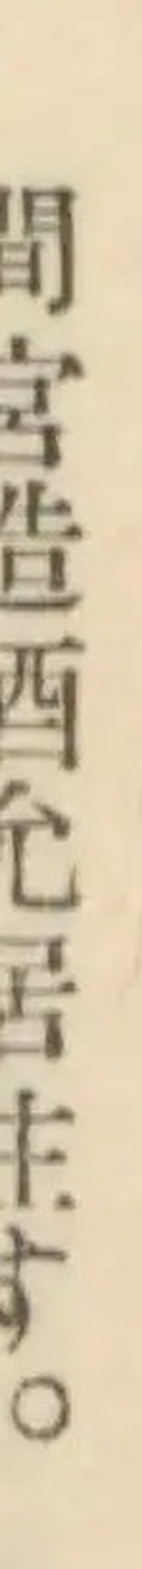間宮造酒允居住す。
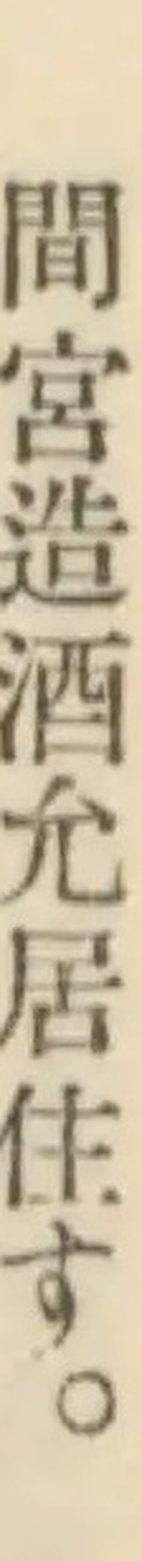間宮造酒允居住す。
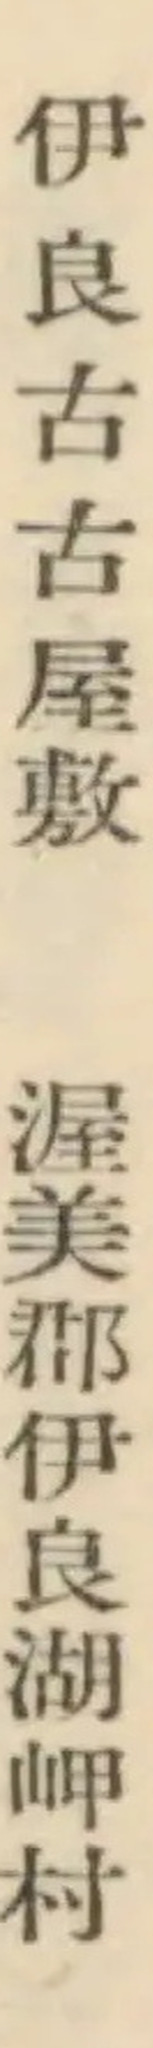伊良古古屋敷渥美郡伊良湖岬村
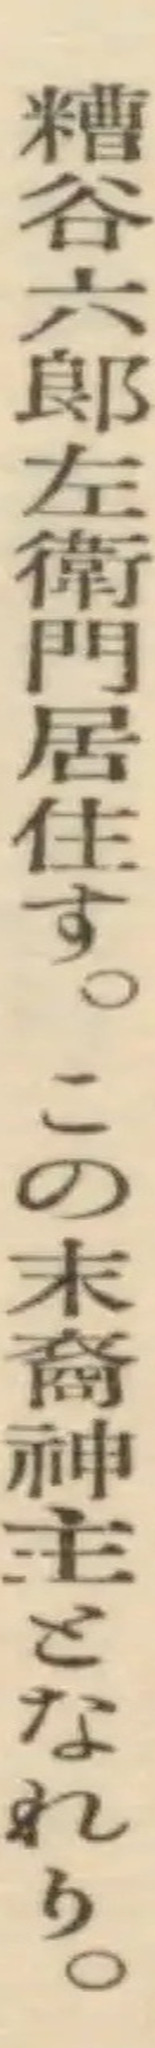糟谷六郎左衛門居住す。この末裔神主となれり。
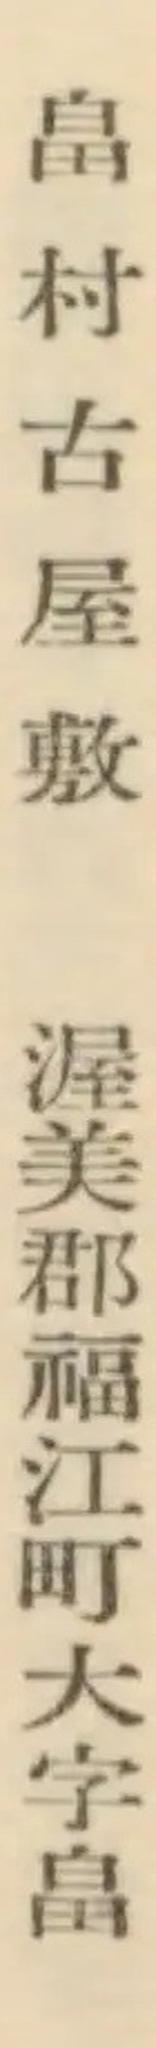畠村古屋敷渥美郡福江町大字畠
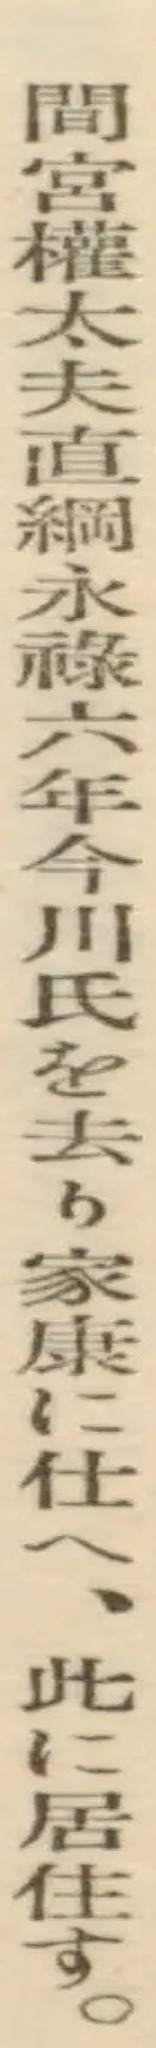間宮権太夫直綱永禄六年今川氏を去り家康に仕へ、此に居住す。
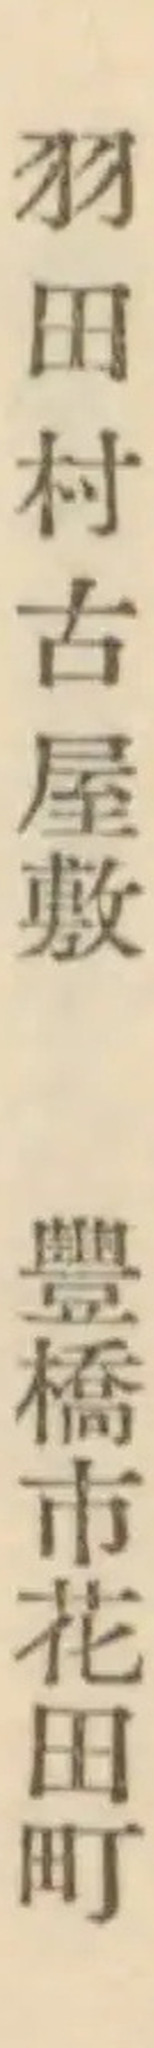羽田村古屋敷豊橋市花田町
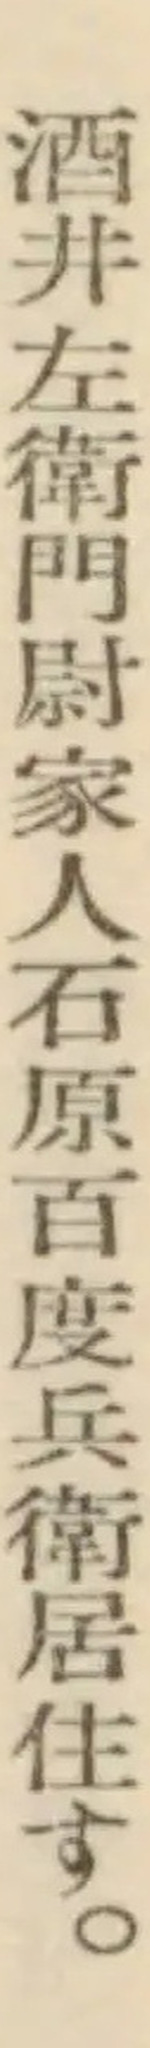酒井左衛門尉家人石原百度兵衛居住す。
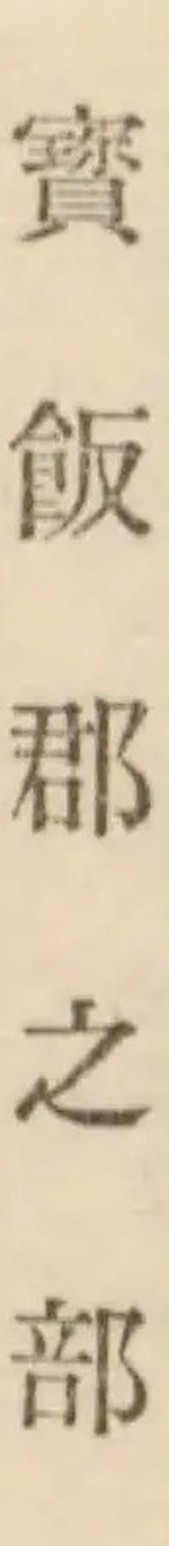宝飯郡之部
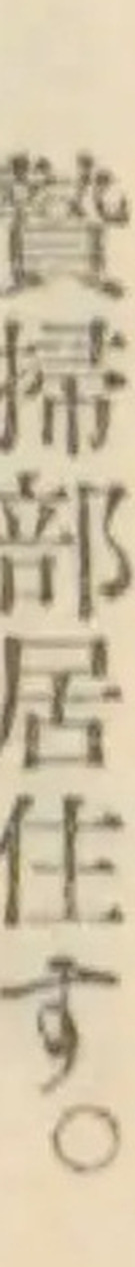贄掃部居住す。
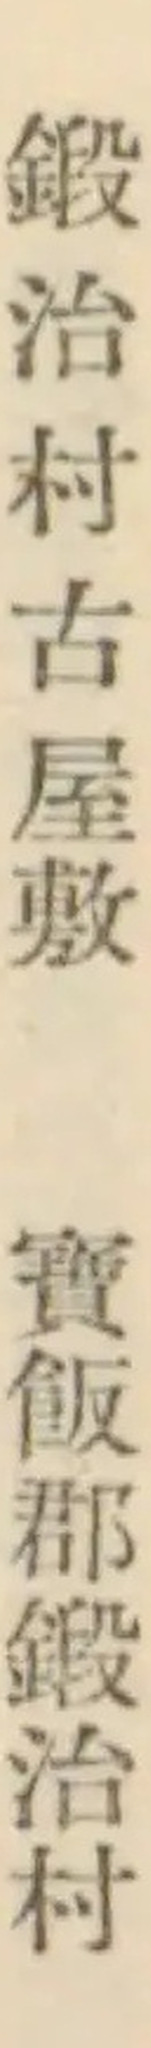鍛冶村古屋敷宝飯郡鍛冶村
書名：東三河之古城
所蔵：国立国会図書館 National Diet Library, JAPAN
